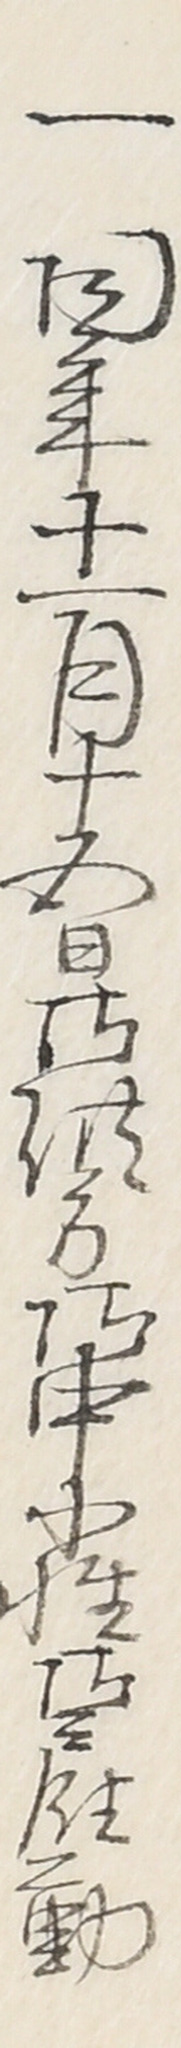一同年十一月十五日御供方中小姓御雇勤
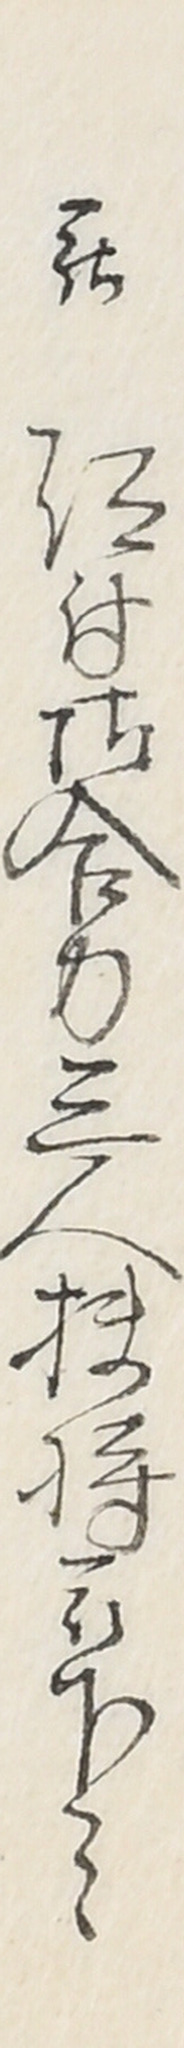被仰付御合力三人扶持被下之
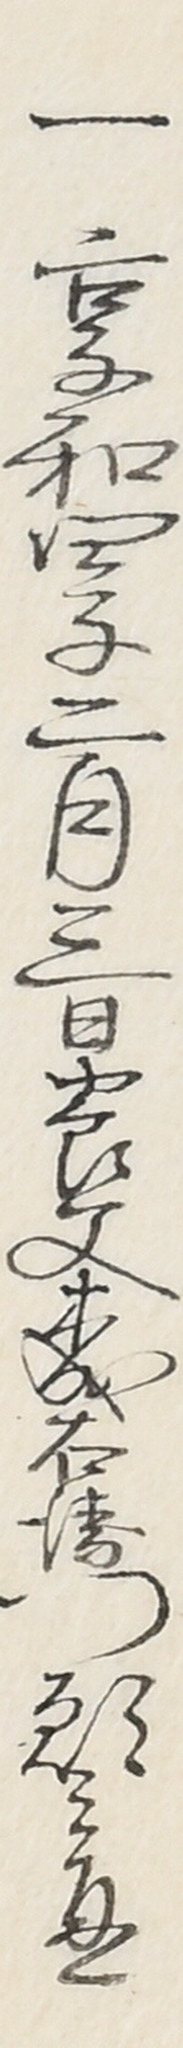一享和四子二月三日養父森右衛門願之通
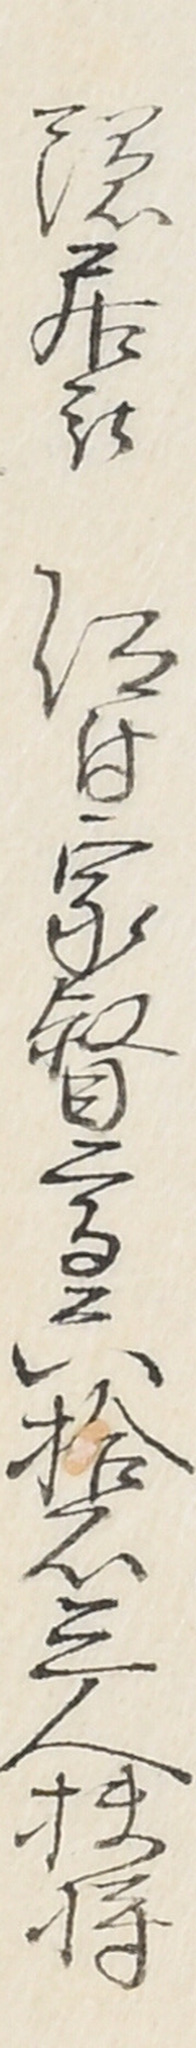隠居被仰付家督高六拾石三人扶持
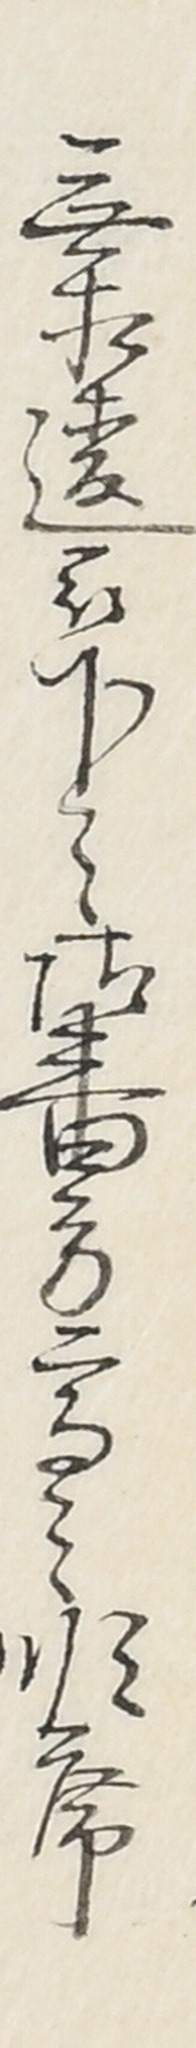無相違被下之御番方高之順席
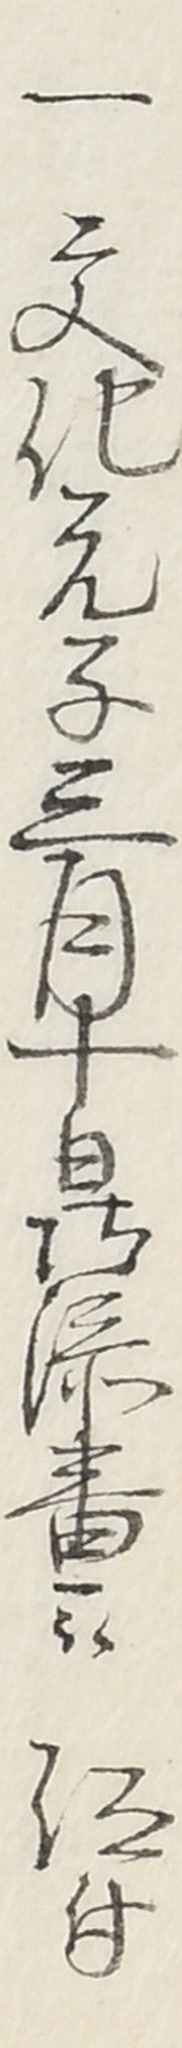一文化元子三月十日御添書被仰付
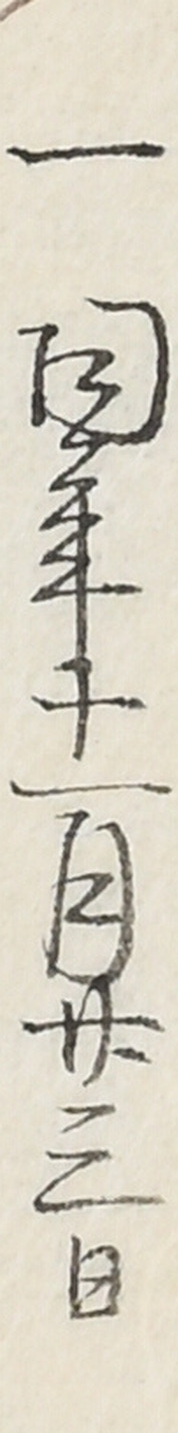一同年十一月廿三日
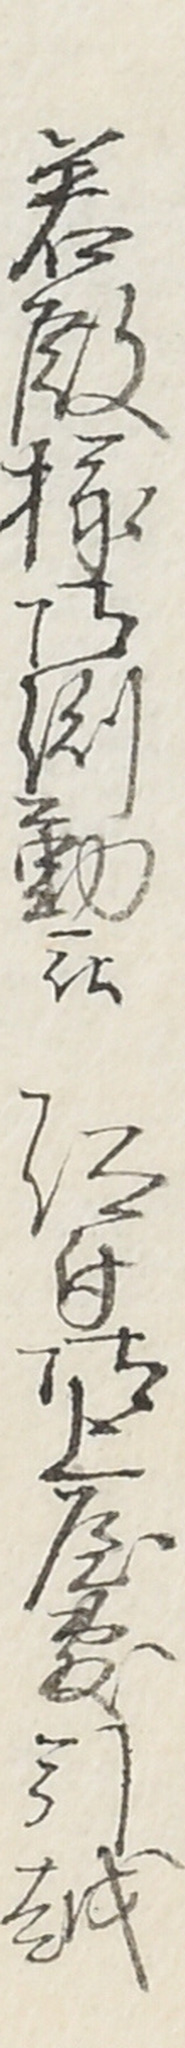若殿様御側勤被仰付御上屋敷引越
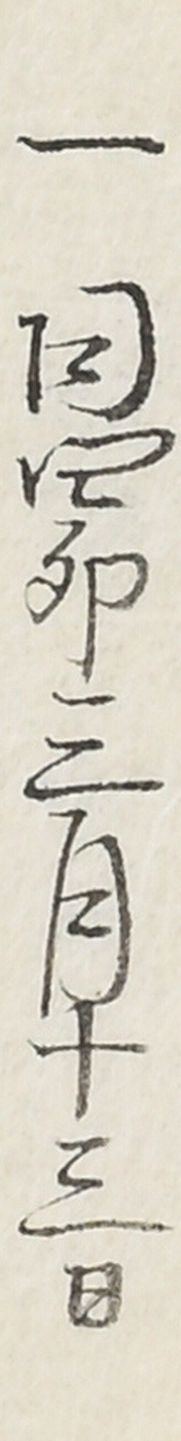一同四卯三月十三日
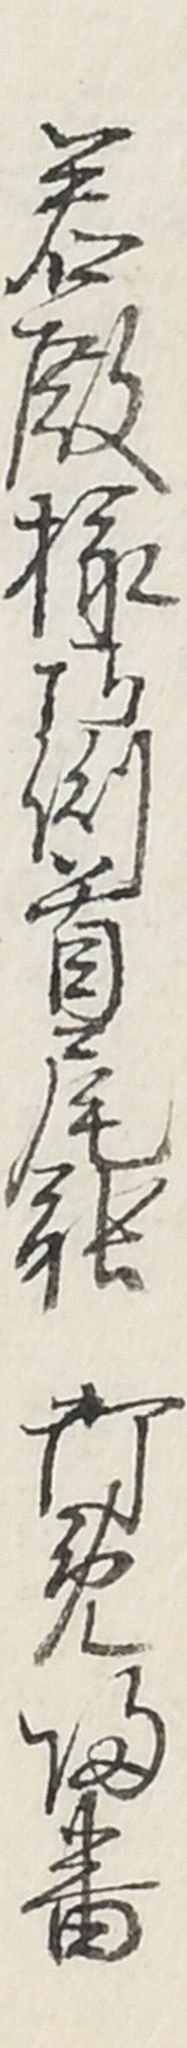若殿様御側首尾能御免帰番
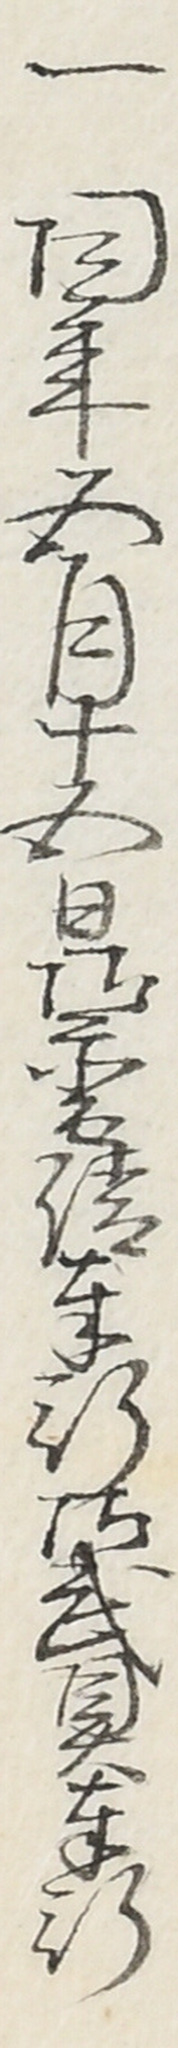一同年五月十五日御普請奉行御武具奉行
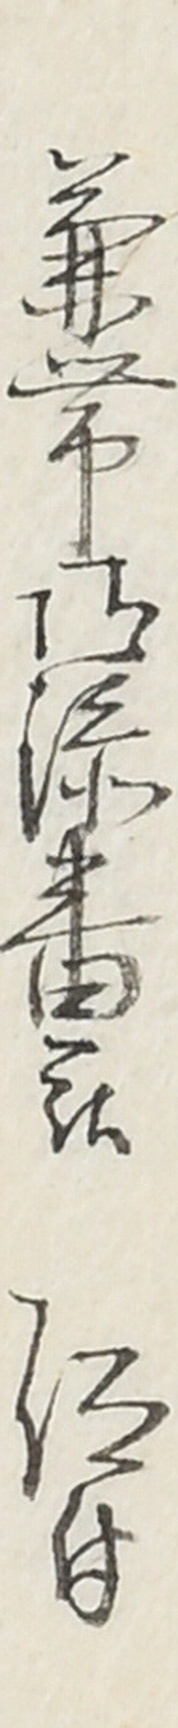兼帯御添書被仰付
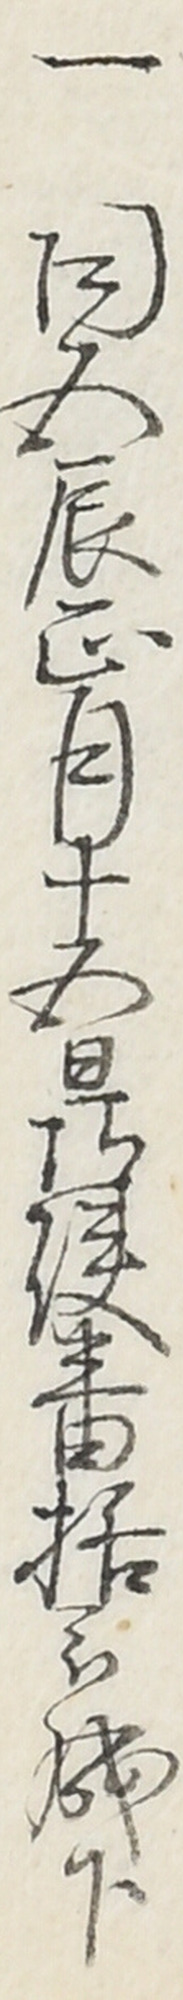一同五辰正月十五日御使番格被成下
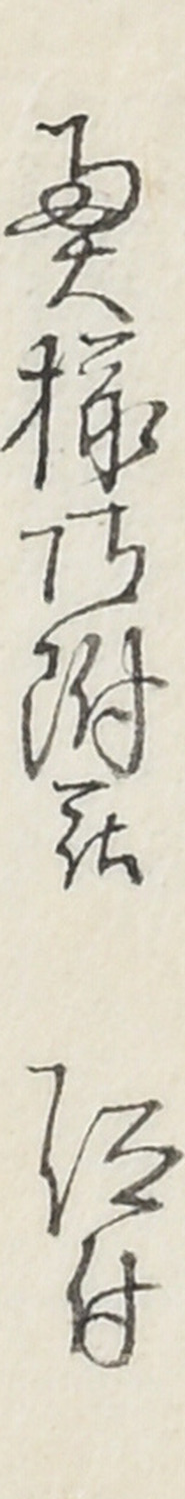奥様御附被仰付
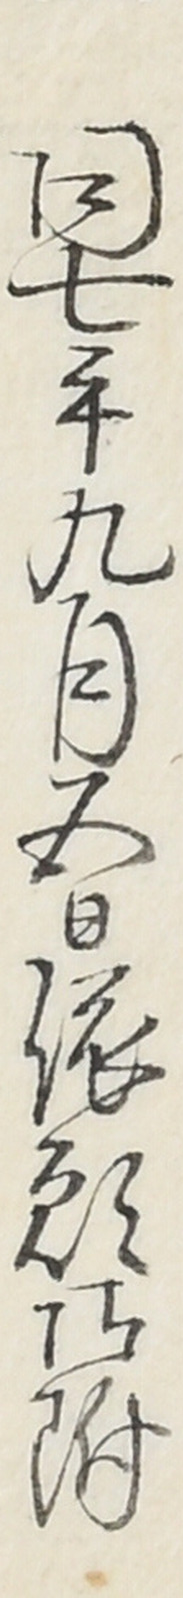一同七年九月五日依願御附
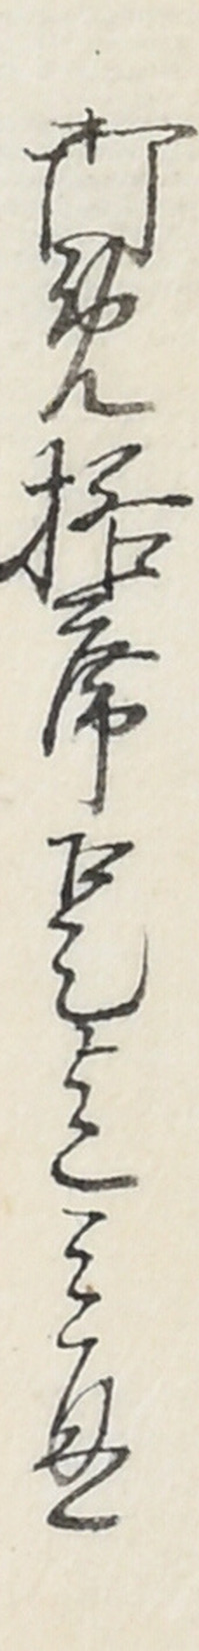御免格席是迄之通
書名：給人諸士勤仕録（七）
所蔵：伊那市立高遠町図書館・合同会社AMANE
